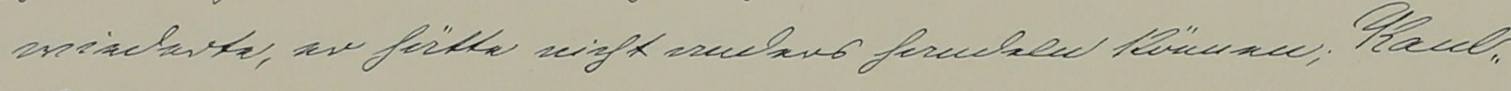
wiederte, er hätte nicht anders handeln können; Kaul-
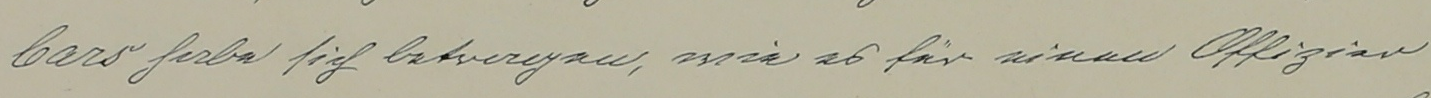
bars habe sich betragen, wie es für einen Offizier
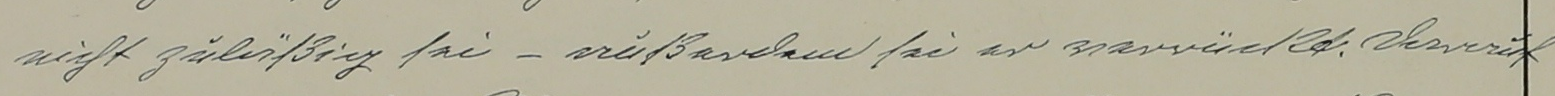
nicht zuläßig sei – außerdem sei er verrückt. Darauf
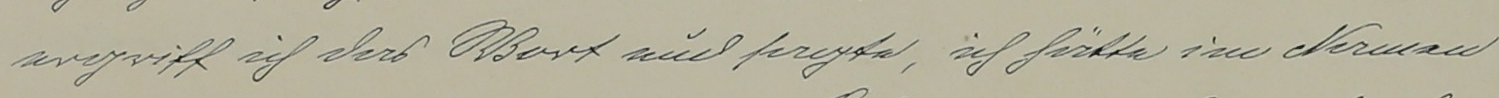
ergriff ich das Wort und sagte, ich hätte im Namen
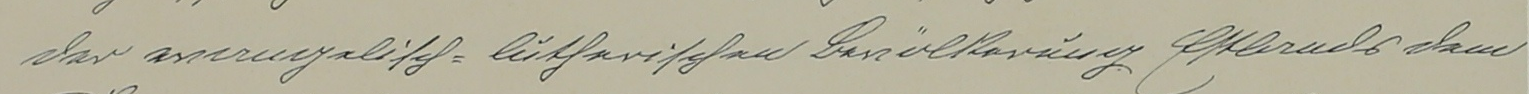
der evangelisch-lutherischen Bevölkerung Estlands dem
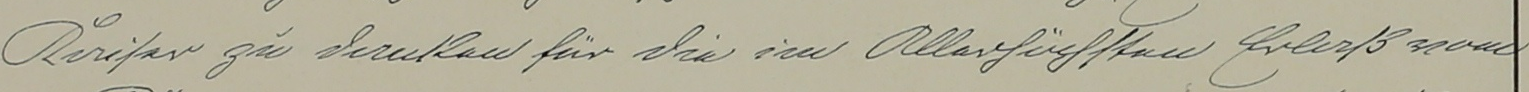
Kaiser zu danken für die im Allerhöchsten Erlaß vom
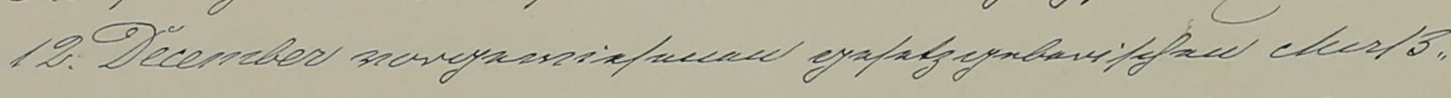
12. December vorgewiesenen gesetzgeberischen Maß-
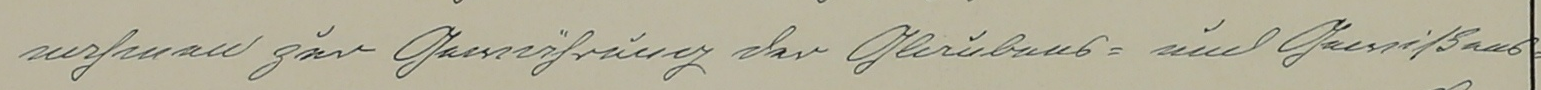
nahmen zur Gewährung der Glaubens- und Gewißens-
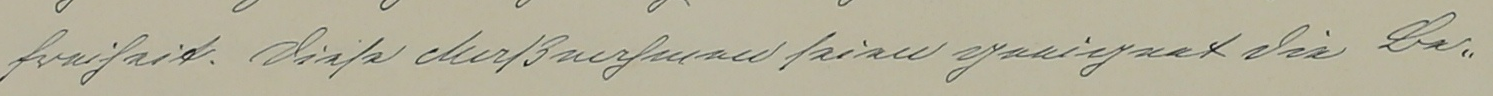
freiheit. Diese Maßnahmen seien geeignet, die Be-
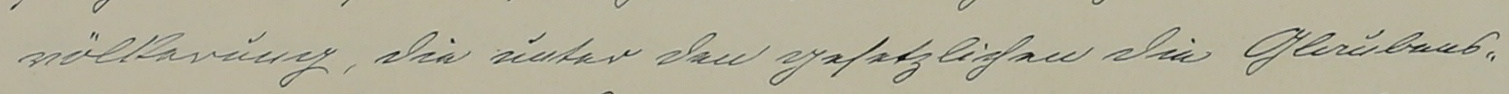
völkerung, die unter den gesetzlichen, die Glaubens-
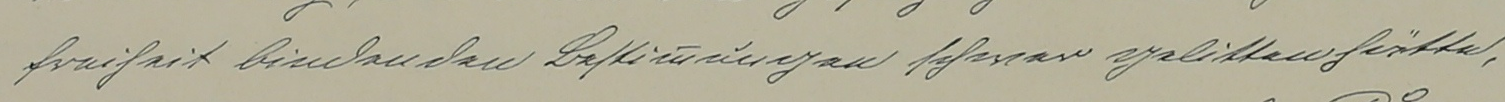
freiheit bindenden Bestimmungen schwer gelitten hätte,
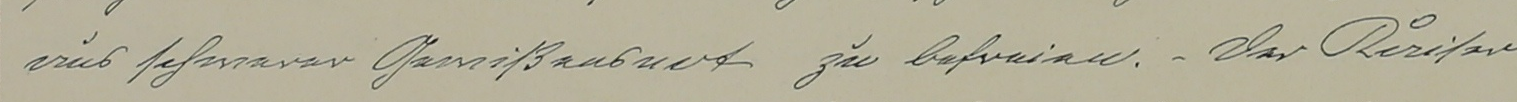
aus schwerer Gewißensnot zu befreien. – Der Kaiser
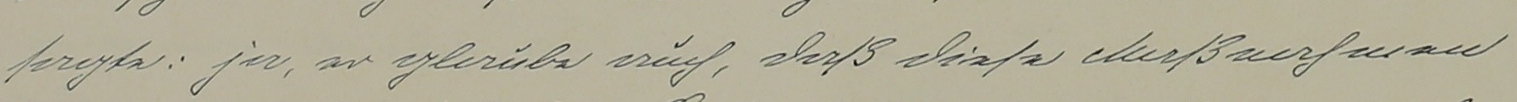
sagte: ja, er glaube auch, daß diese Maßnahmen
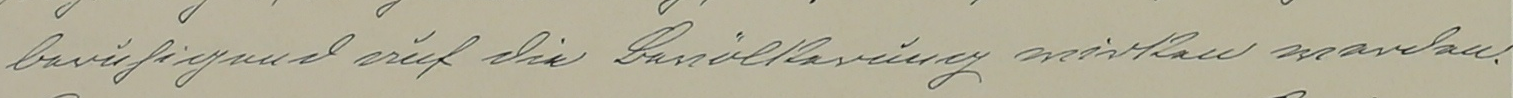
beruhigend auf die Bevölkerung wirken werden.
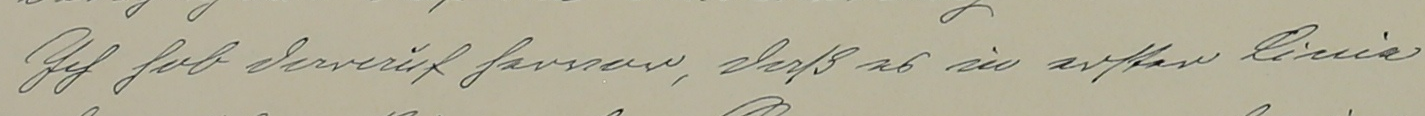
Ich hob darauf hervor, daß es in erster Linie
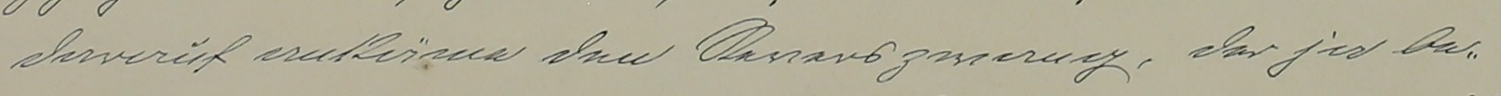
darauf ankäme, den Reverszwang, der ja be-
